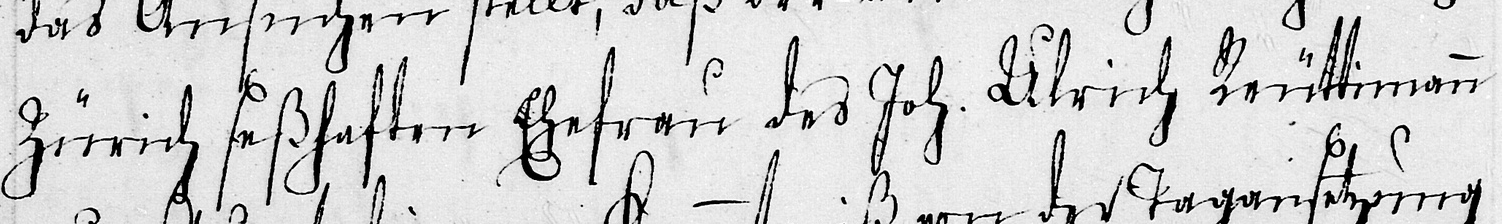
Zürich seßhaften Ehefrau des Joh. Ulrich Reuttimann
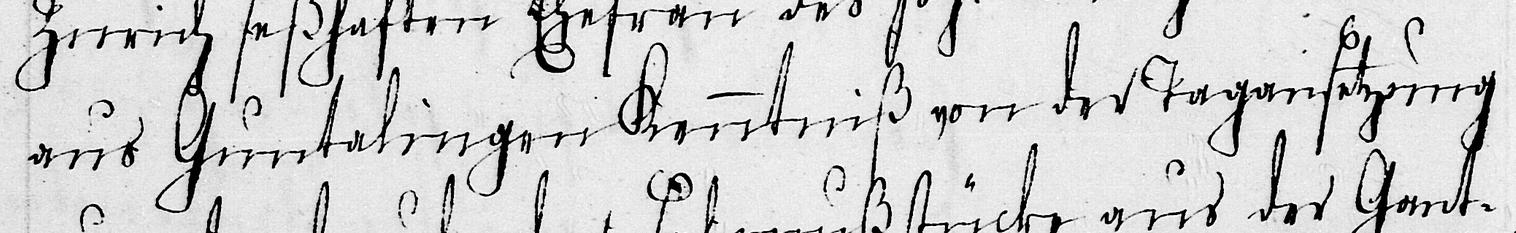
aus Guntalingen Kenntniß von der Tagansetzung
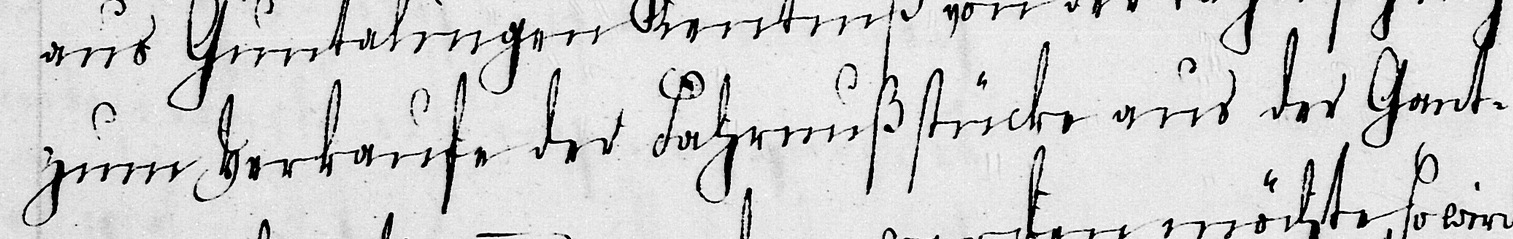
zum Verkaufe der Fahrnußstücke aus der Gant¬
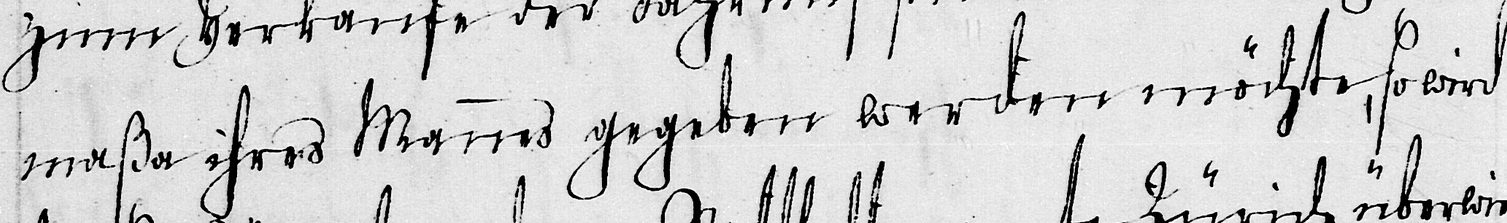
maßa ihres Mannes gegeben werden möchte, so wird
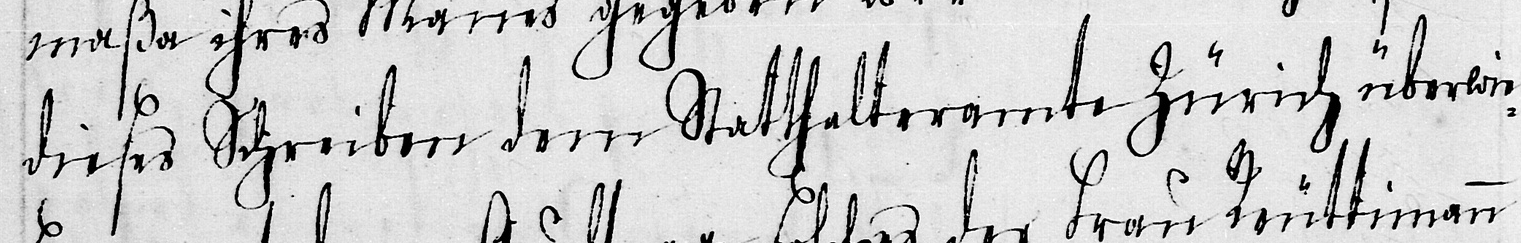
dieses Schreiben dem Statthalteramte Zürich überwi¬
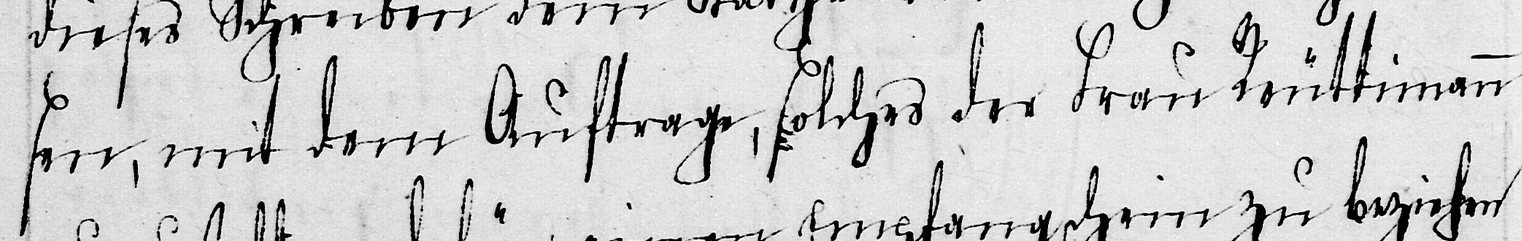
esen, mit dem Auftrage, solches der Frau Reuttimann
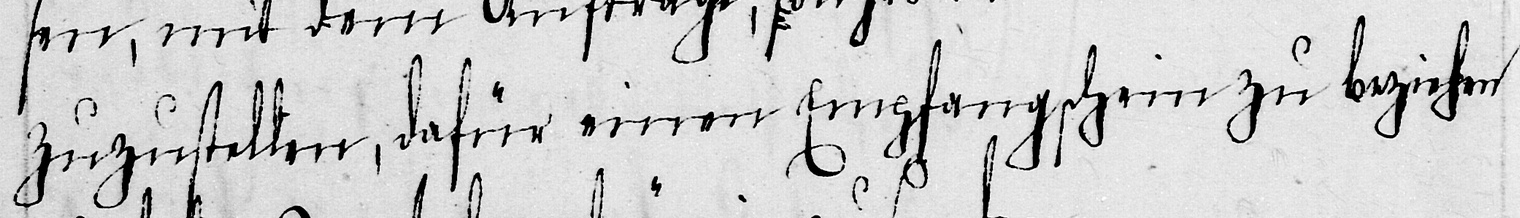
zuzustellen, dafür einen Empfangschein zu beziehen
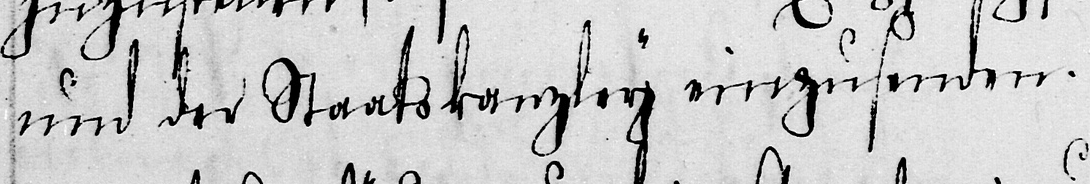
und der Staatskanzley einzusenden.
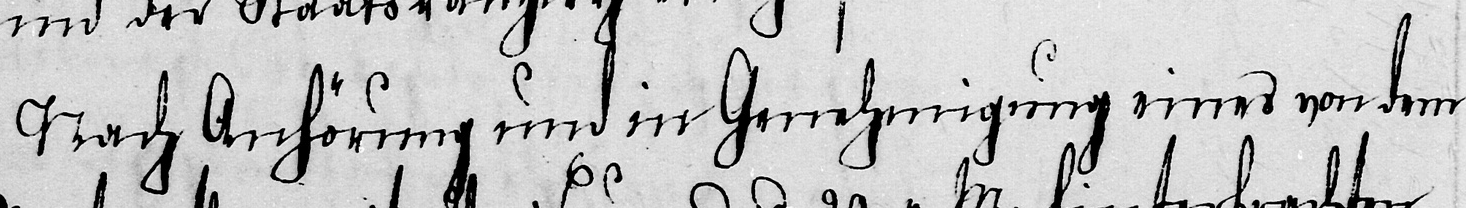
Nach Anhörung und in Genehmigung eines von dem
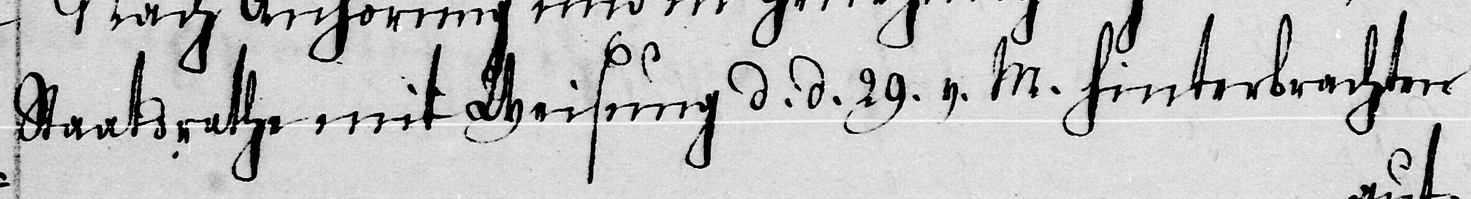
Staatsrathe mit Weisung d. d. 29. v. M. hinterbrachten
